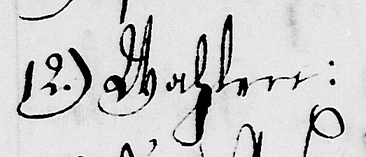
12.) Wahlen:
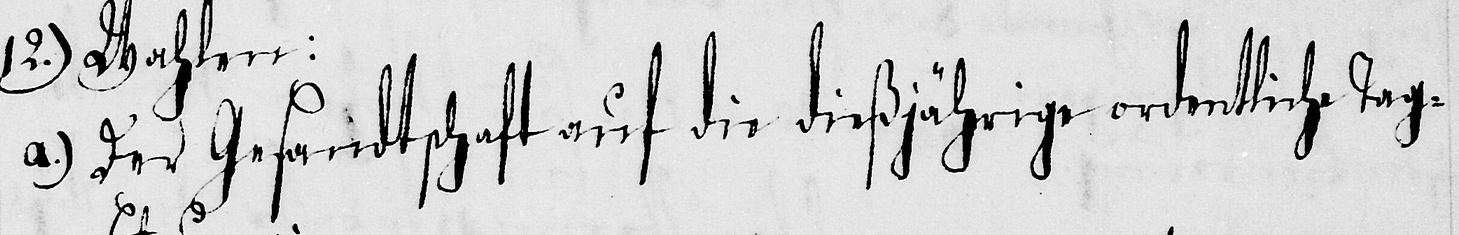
a.) Der Gesandtschaft auf die dießjährige ordentliche Ta¬
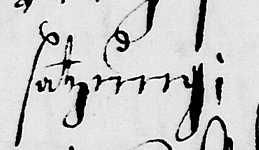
satzung;
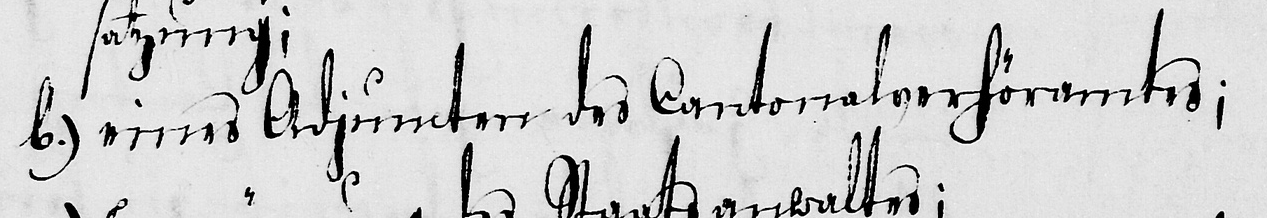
b.) eines Adjuncten des Cantonalverhöramtes;
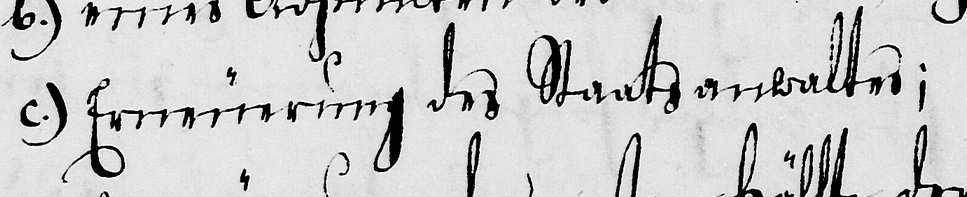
c.) Erneuerung des Staatsanwaltes;
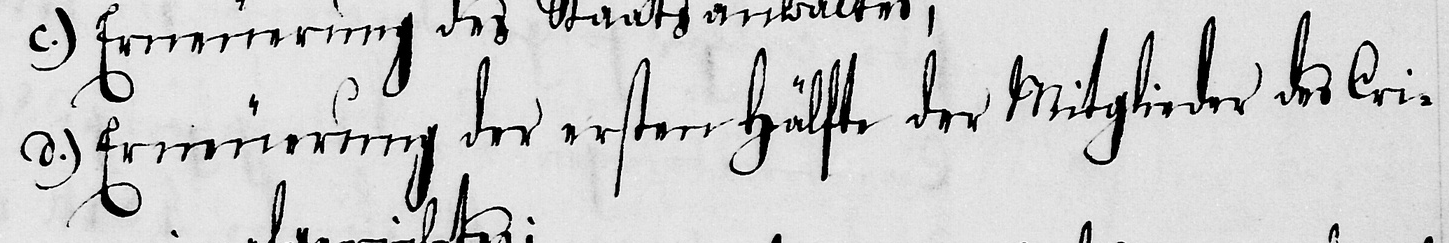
d.) Erneuerung der ersten Hälfte der Mitglieder des Cri¬
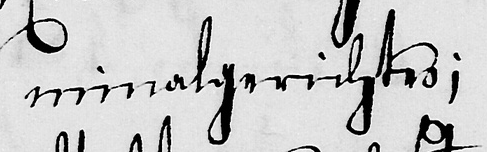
minalgerichtes;
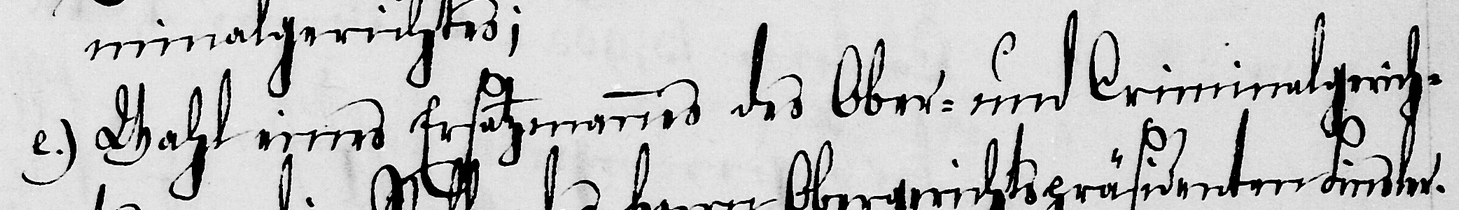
e.) Wahl eines Ersatzmannes des Ober- und Criminalgerich¬
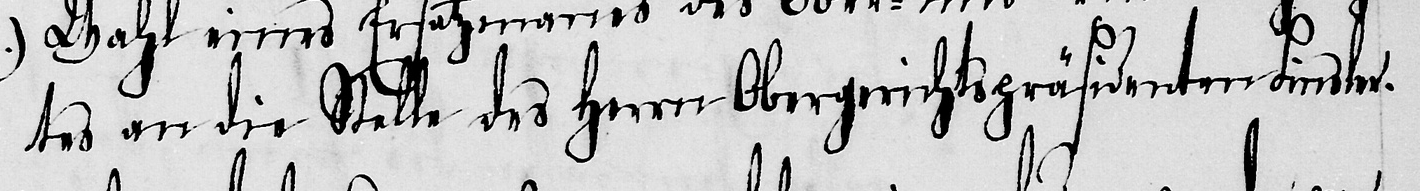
tes an die Stelle des Herrn Obergerichtspräsidenten Finsler.
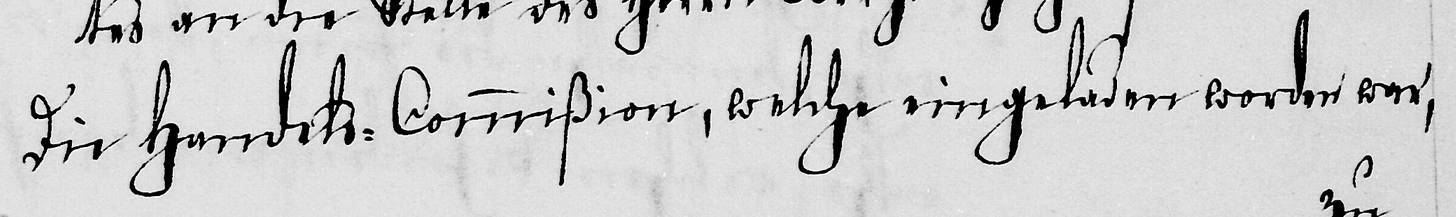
Die Handels-Commißion, welche eingeladen worden war,
